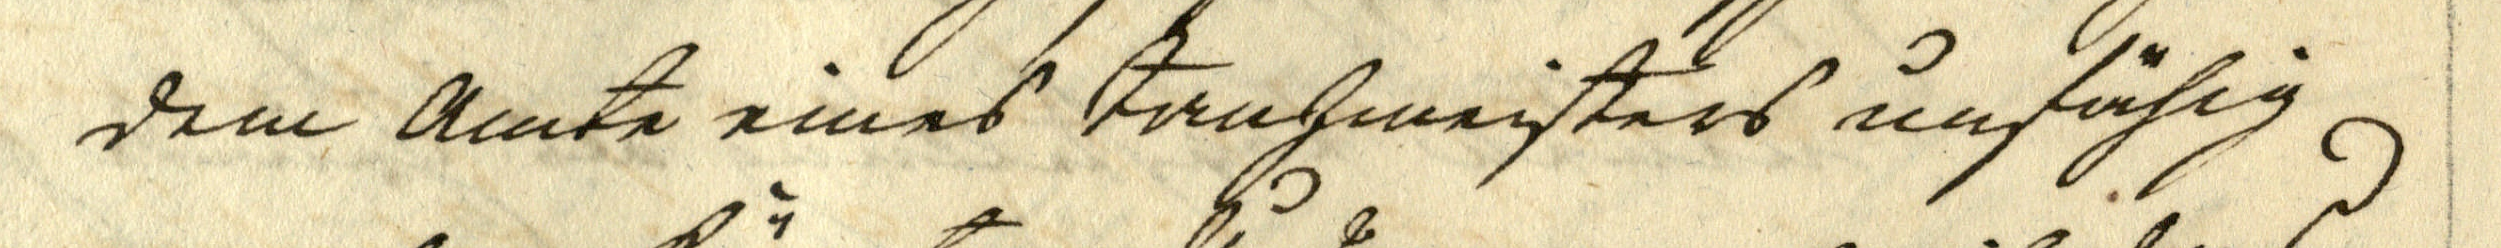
dem Amte eines Tanzmeisters unfähig
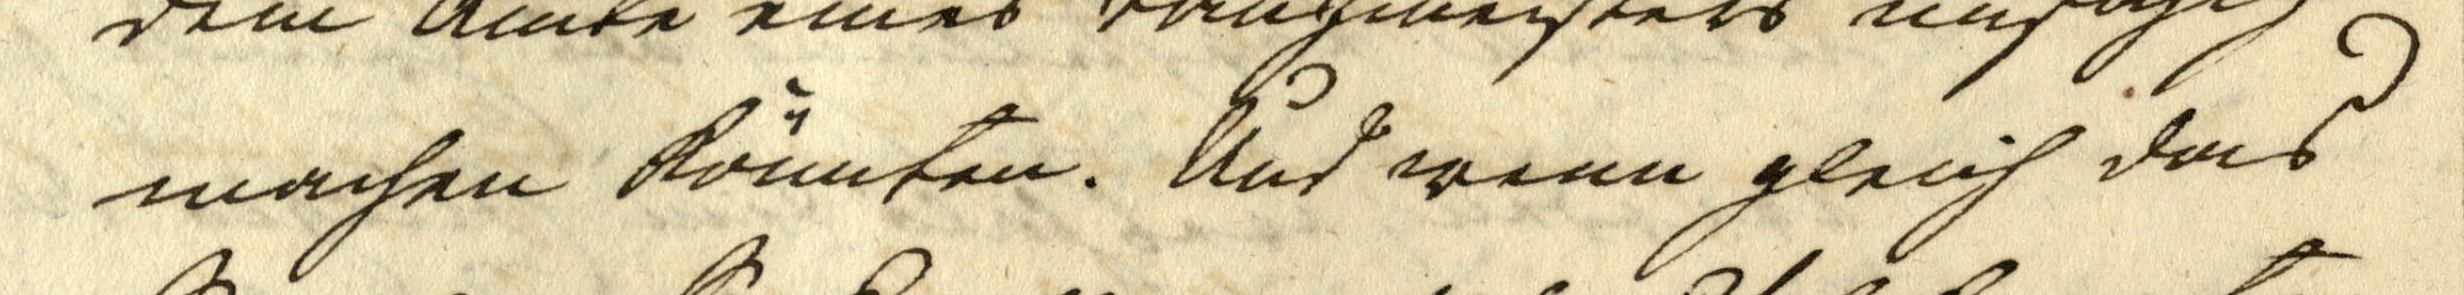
machen könnten. Und wenn gleich das
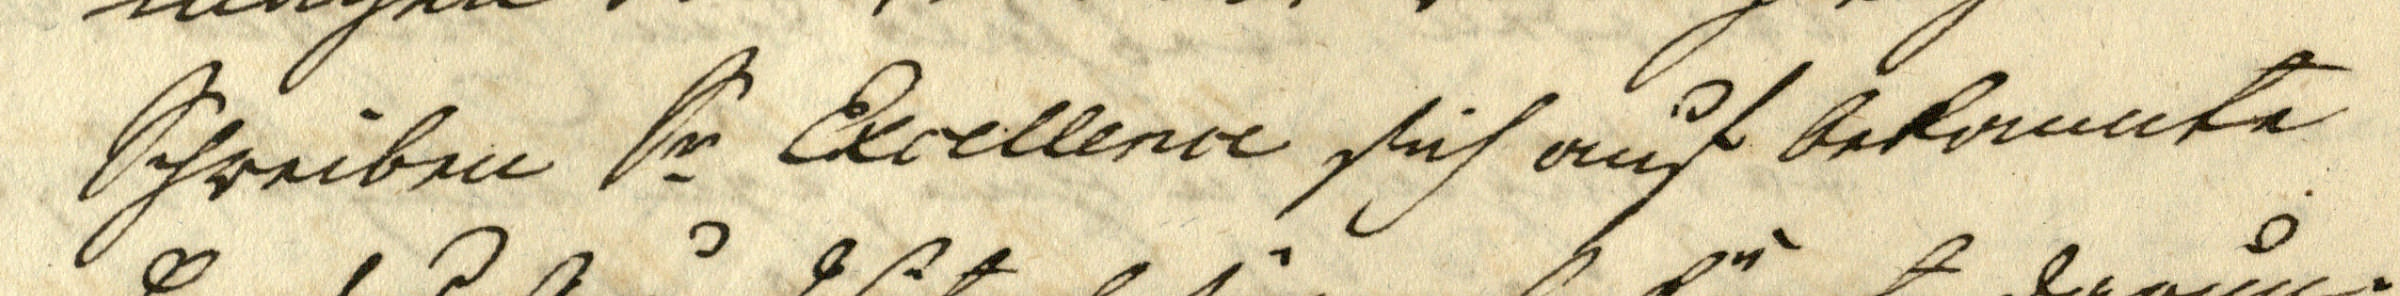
Schreiben Sr Excellence sich auf bekannte
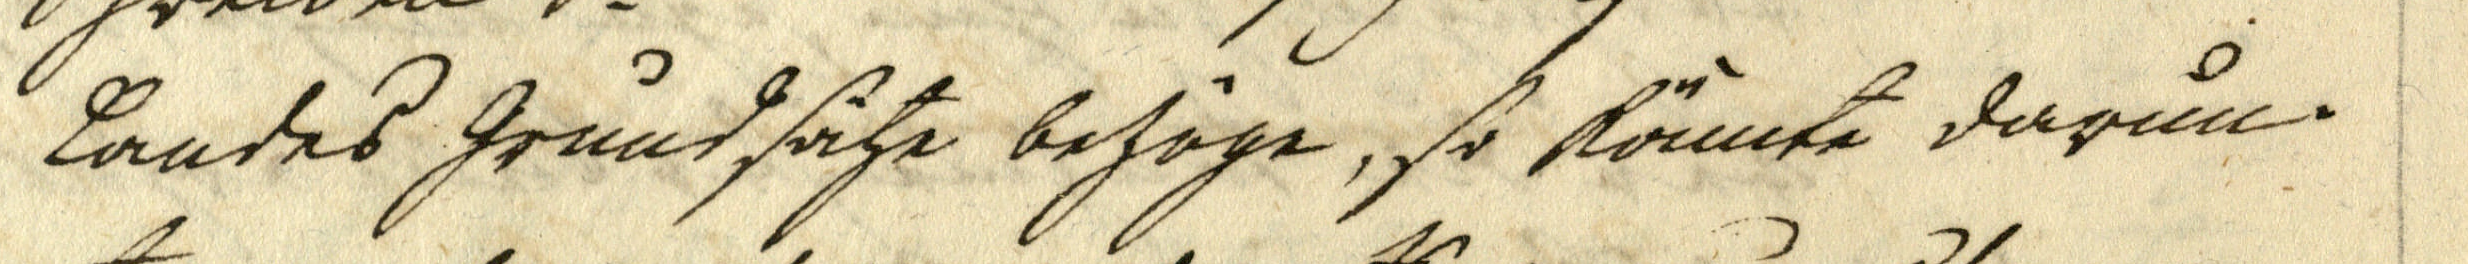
Landes Grund sätze bezöge, so könnte darun¬
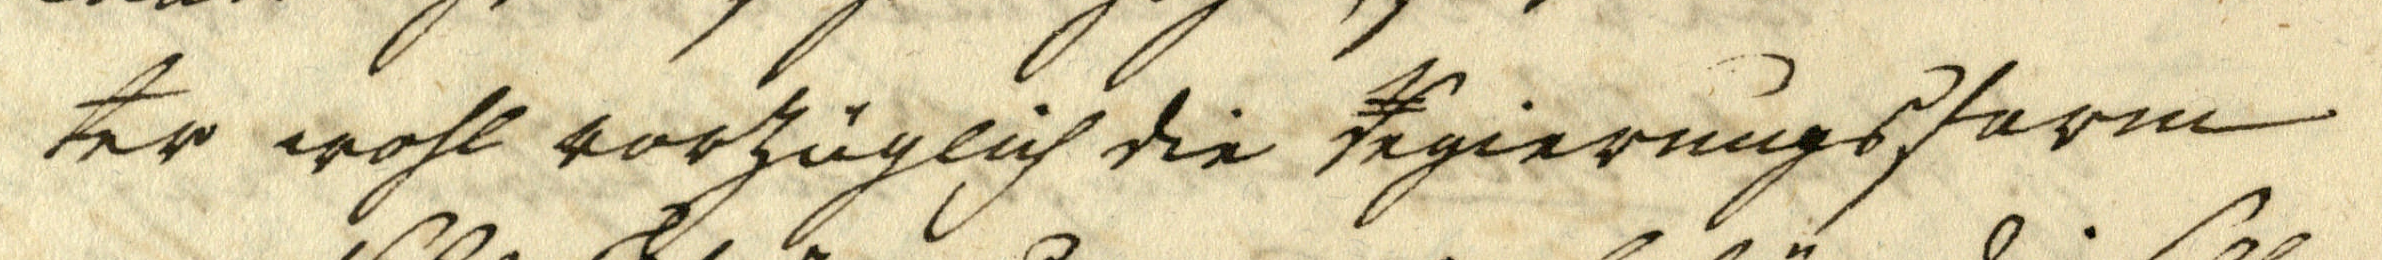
ter wohl vorzüglich die Regierungsform
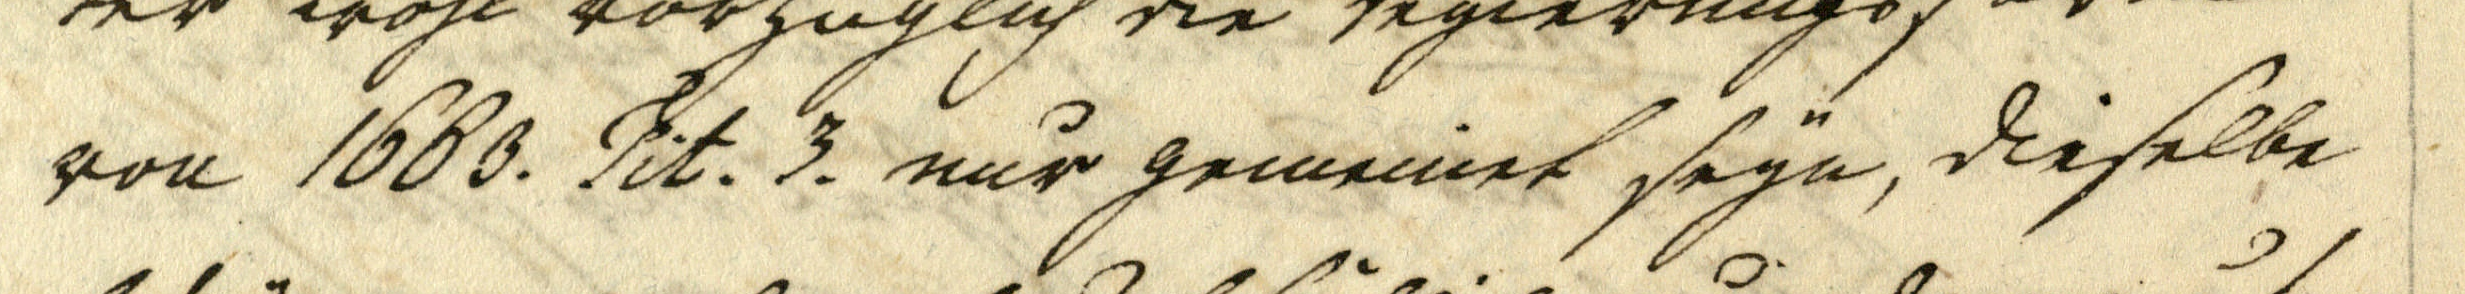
von 1663. Tit. 3. nur gemeinet seÿn, dieselbe
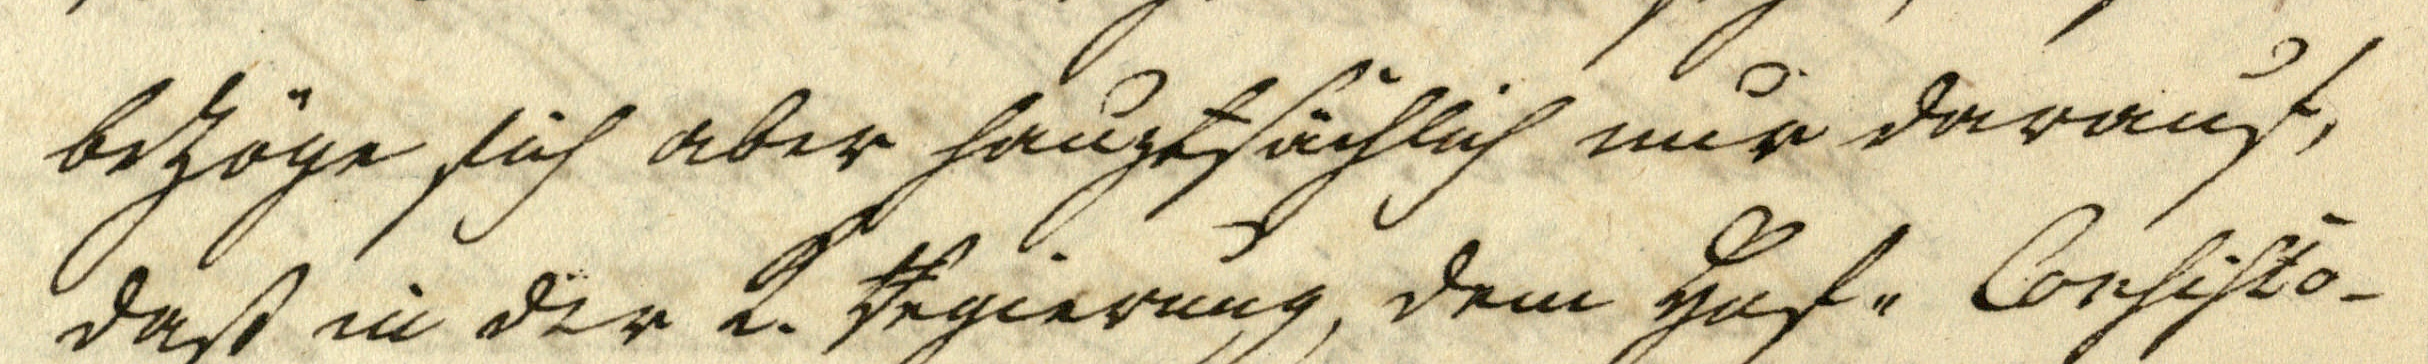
bezöge sich aber hauptsächlich nur darauf,
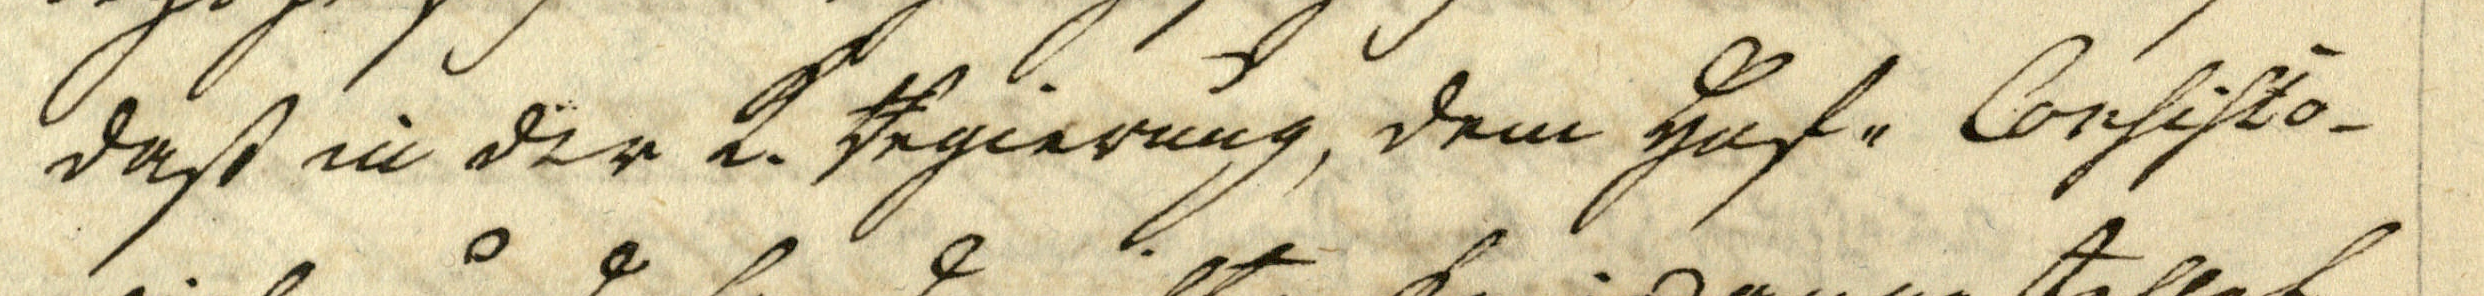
daß in der K. Regierung, dem Hof- Consisto¬
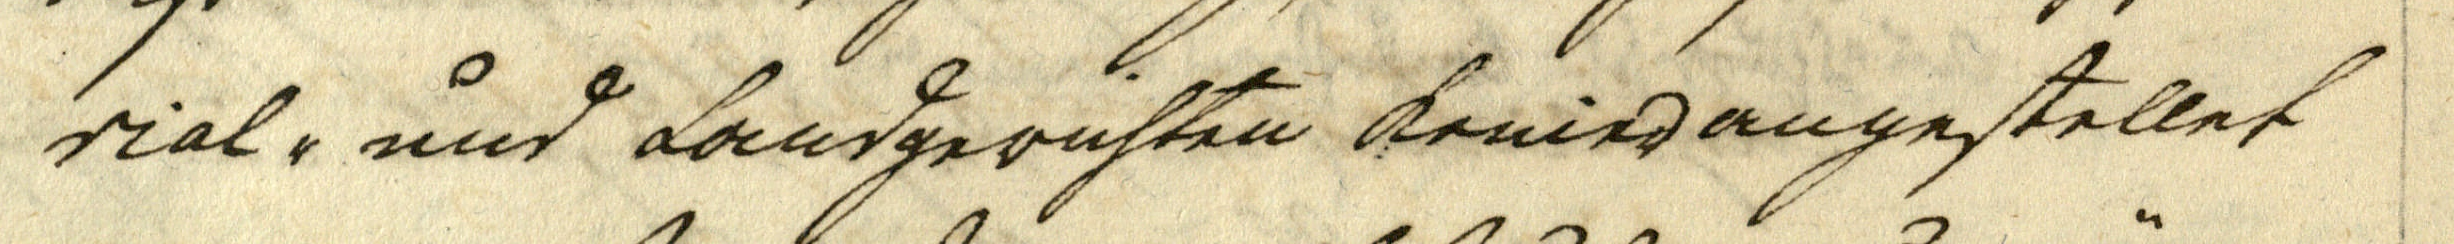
rial-, und Landgerichten keiner angestellet
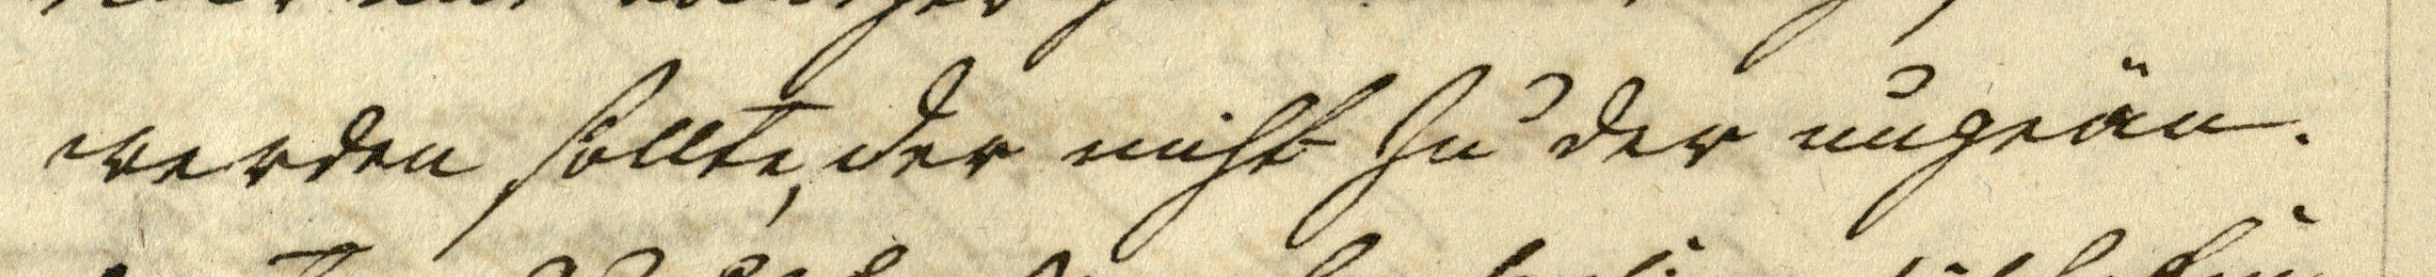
werden sollte, der nicht zu der ungeän¬
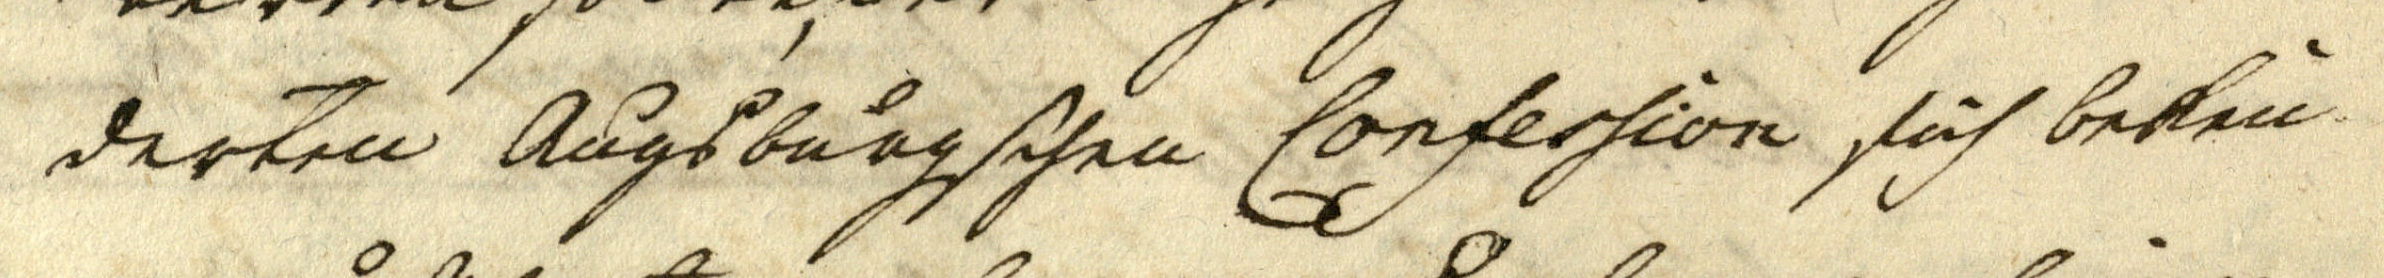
derten Augsburgschen Confession sich beken¬
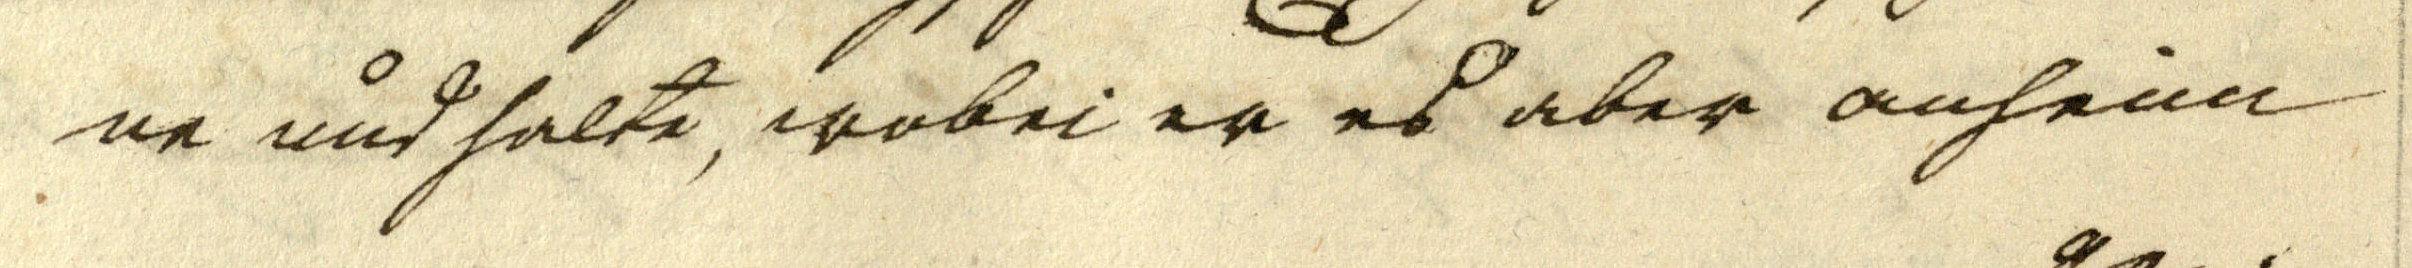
ne und halte, wobei er es aber anheim
